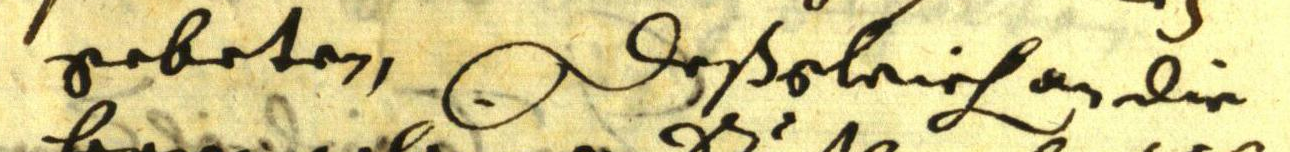gebeten, Deßgleich an die
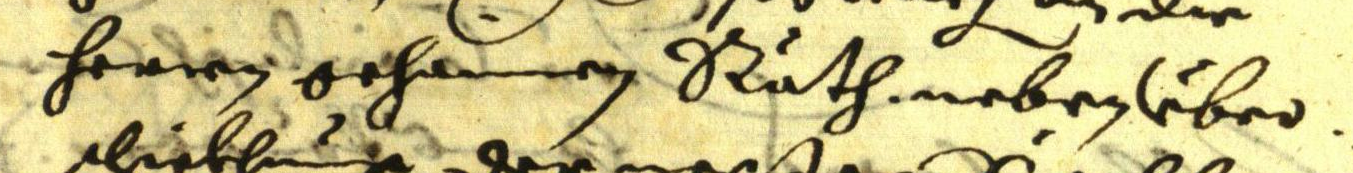herrn gehaimen Rāth. neben v̄ber¬
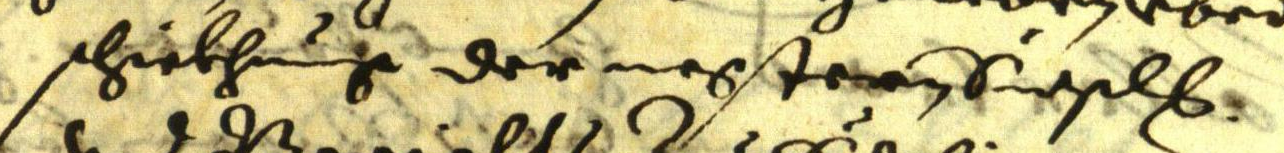schickhūng der negstern Sūpl
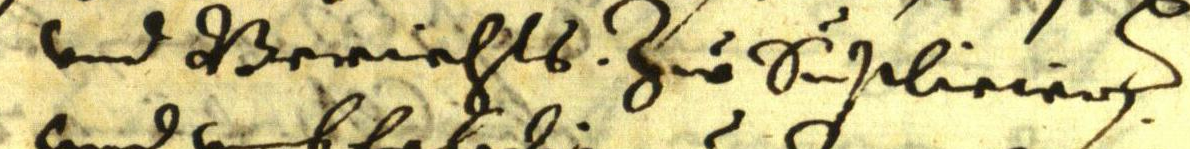vnd Berichts. Zū Sūplicieren.
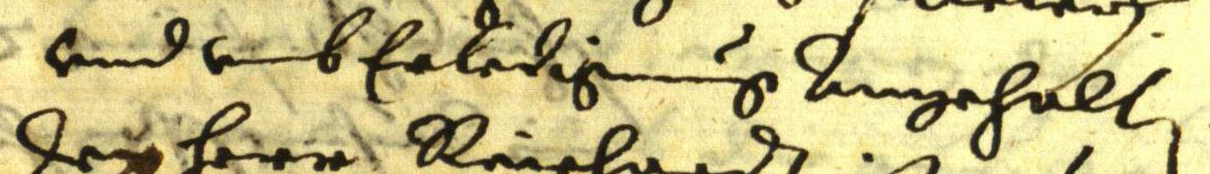vnd vmb Erledigūng Angehalt
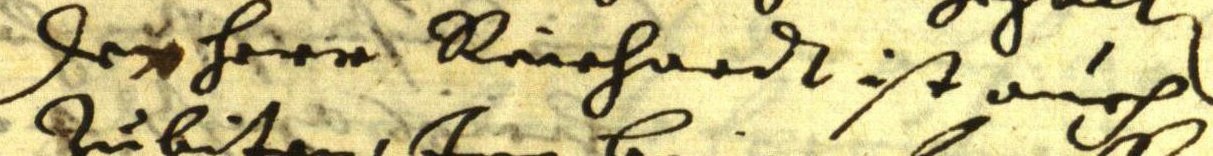der herr Reichardt ist aūch
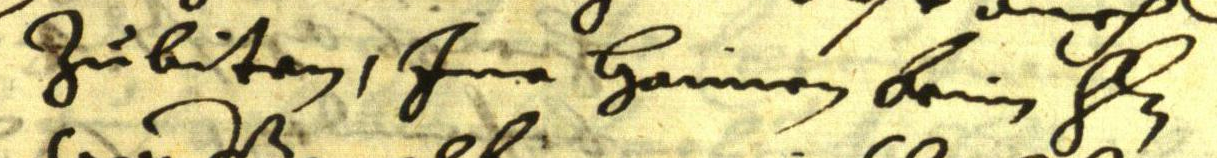Zū biten, Ime Haimen beim hln
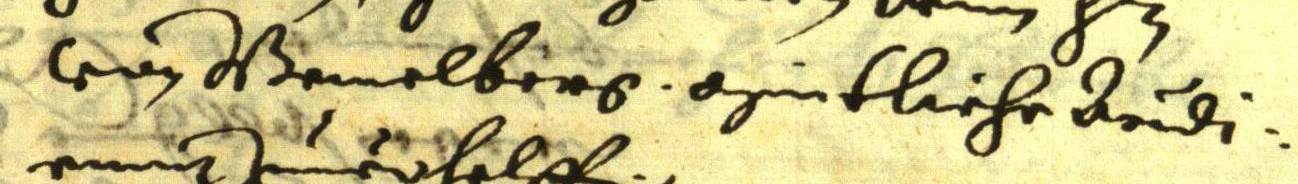von Bemelberg. mintliche Aūdi¬
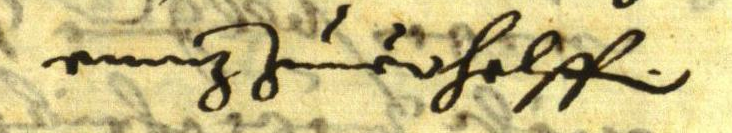ennz Zūūerhelff.
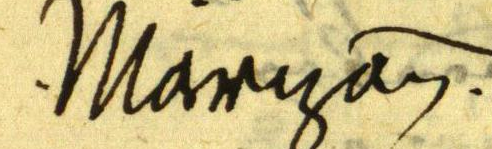Märzän.
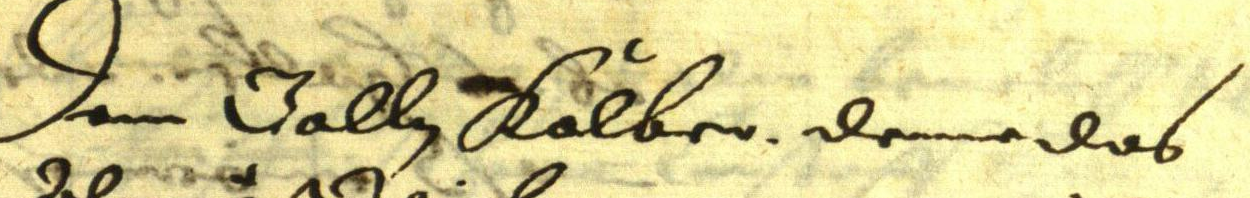Dem Galln Kōlber. deme das
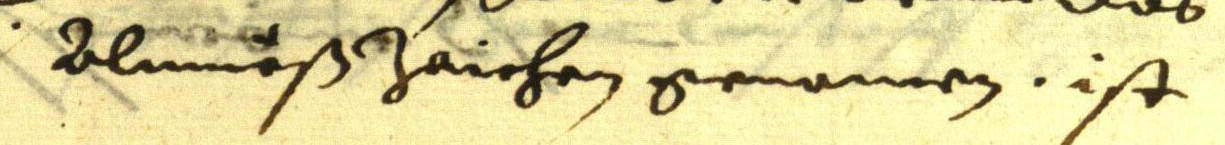Almūeß Zaichen genomen. ist
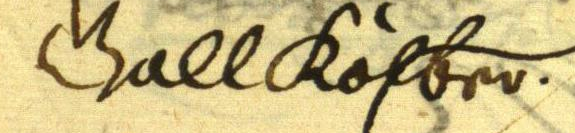Gall Kōlber.
